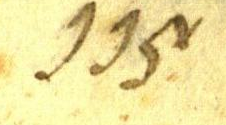115
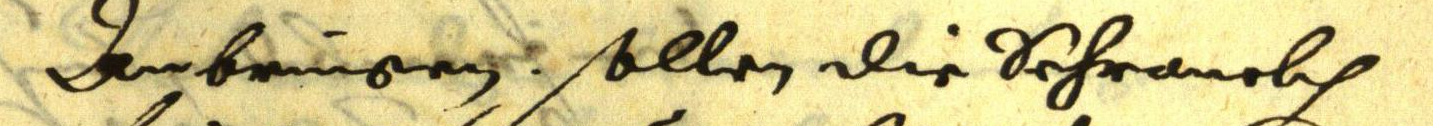Anbringen. sollen die Schranckh
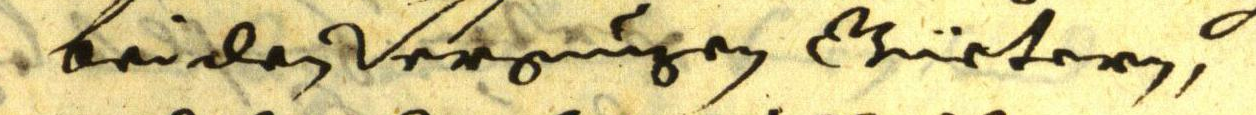bei den Vergnūzen Güetern,
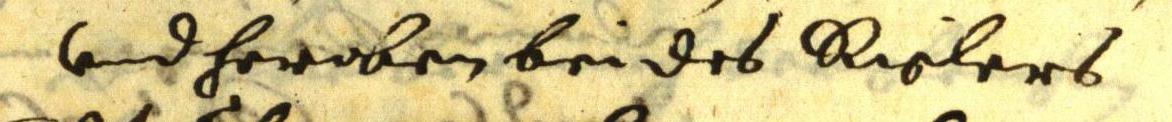vnd heroben bei des Riglers
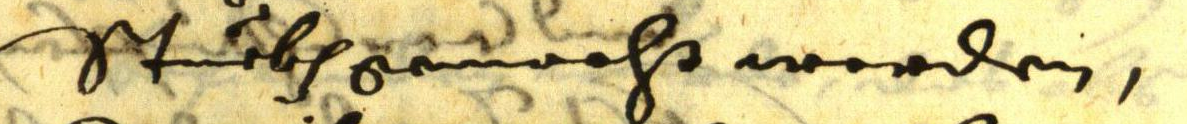Stūckh gemacht werden,
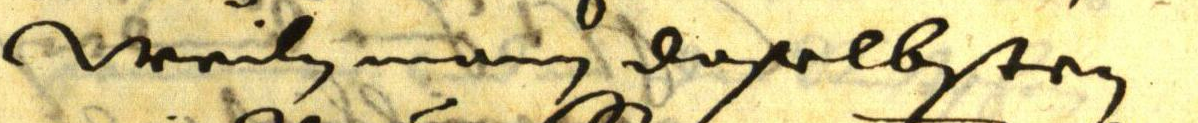Weiln mann daselbsten
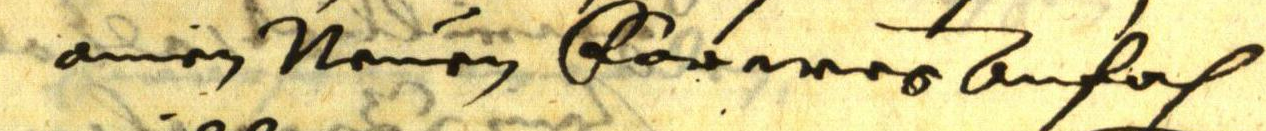ainen Neūen Farweg Anfah
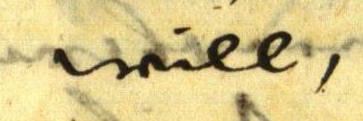will,
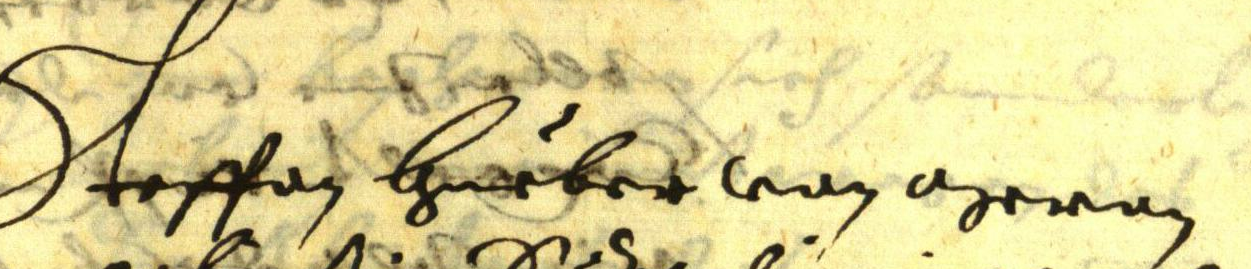Steffan Hūeber von Meran
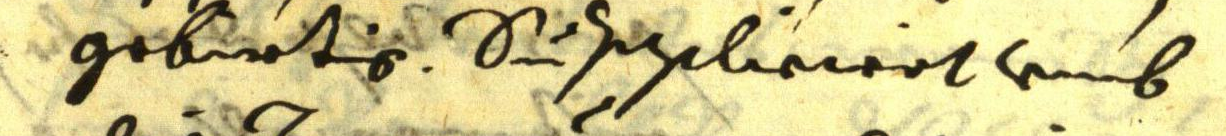gebirtig. SūPpliciert vmb
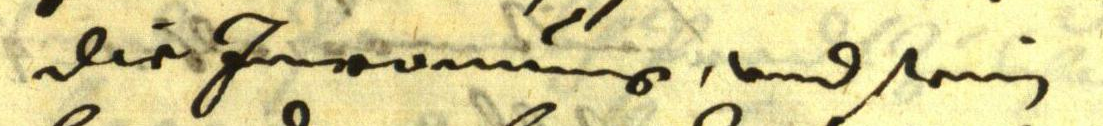die Inwonūng, vnd sein
